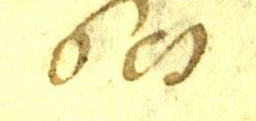68
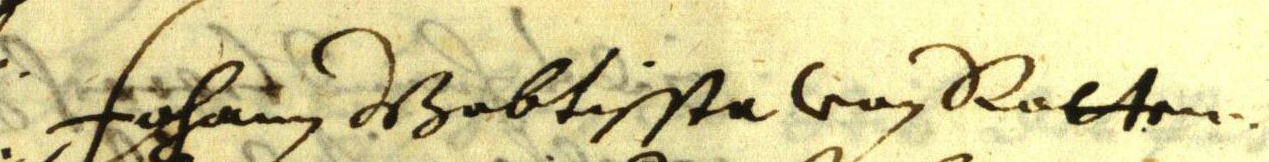Johann Babtissta von Rotten¬
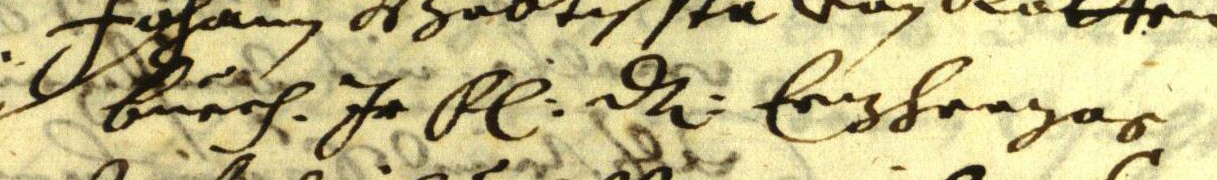būech. Ir Fl: dt: Erzherzog
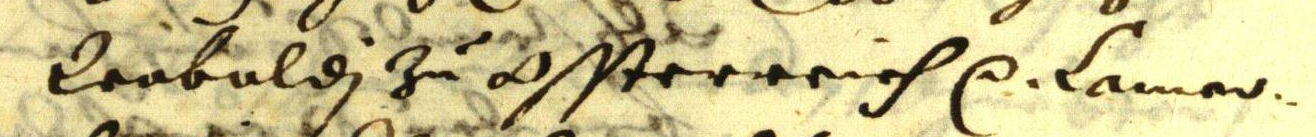Leoboldj Zū Ossterreich etc. Camer¬
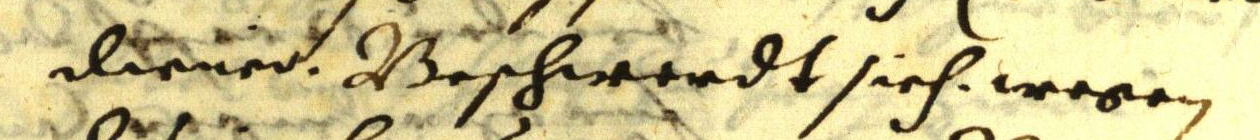diener. Beschwerdt sich. wegen
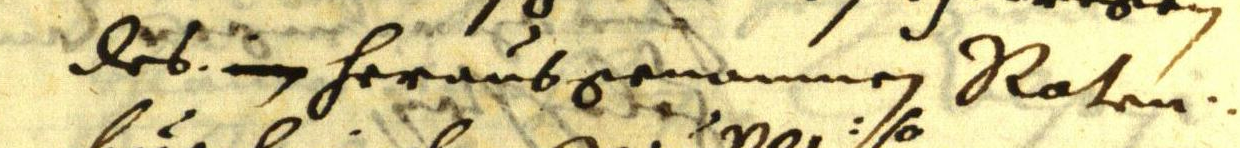des im heraūs genommen Roten¬
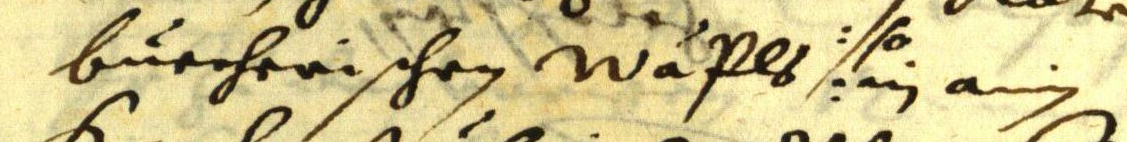būecherischen WāPls :so: in ain
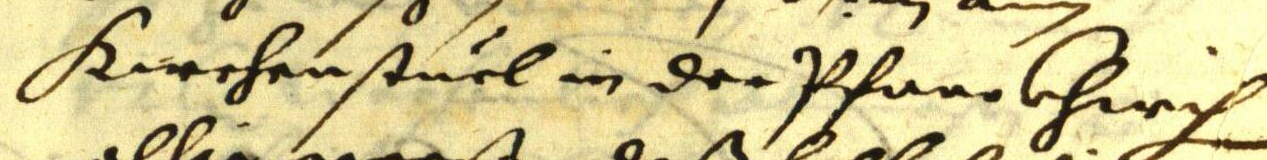Kirchenstūel in der Pfarrkhirch
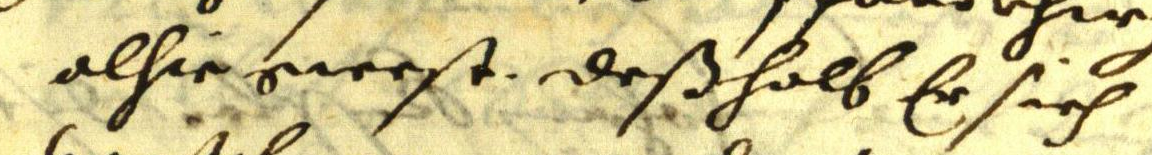alhie gwest. deßhalb Er sich
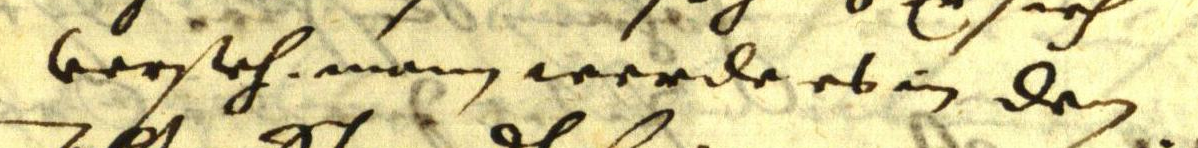versteh. mann werde es in den
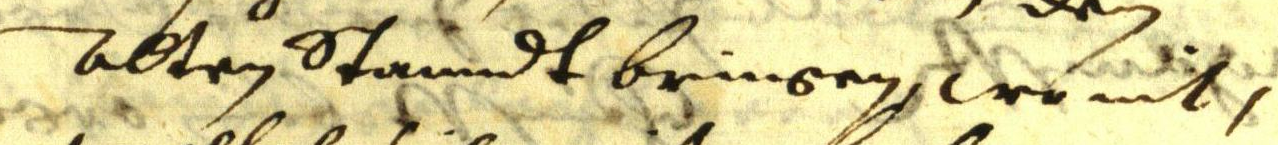Alten Stanndt bringen, wo nit,
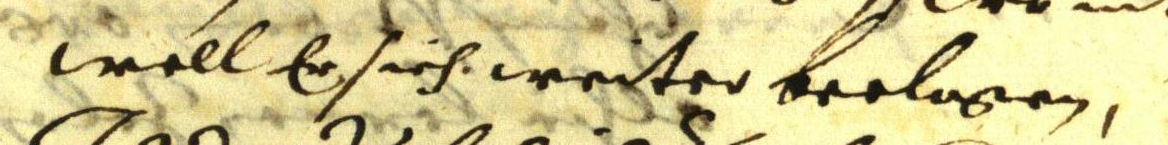well Er sich. weiter beclagen,
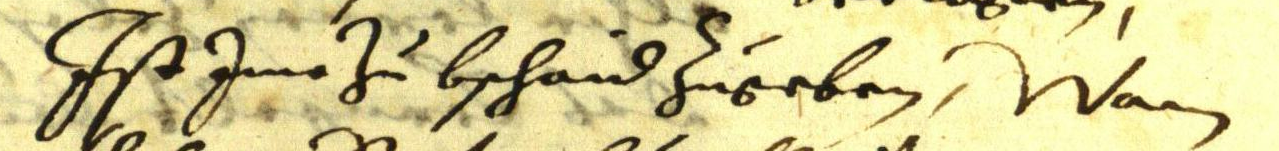Ist Ime Zū bschaid Zūgeben, Wann
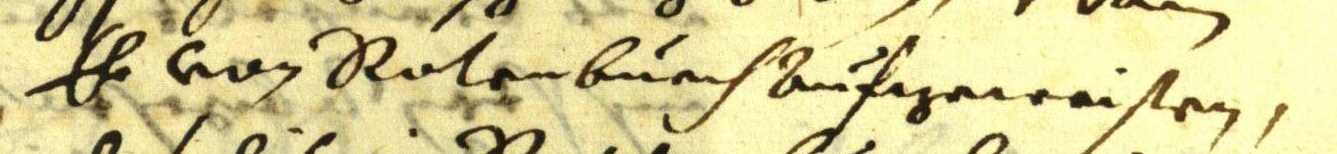Er von Rotenbūech Aūfzeweisen,
